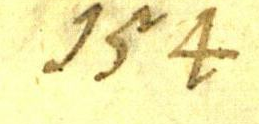154
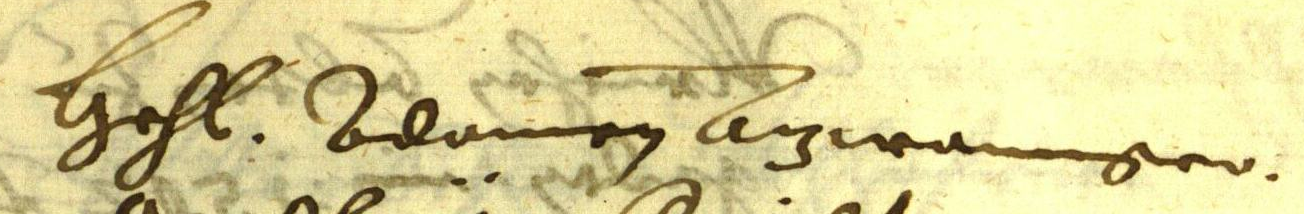Hehl. Adamen Azwannger.
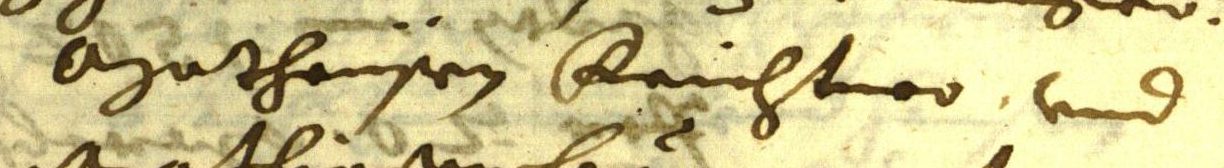Matheüsen Feichtner. vnd
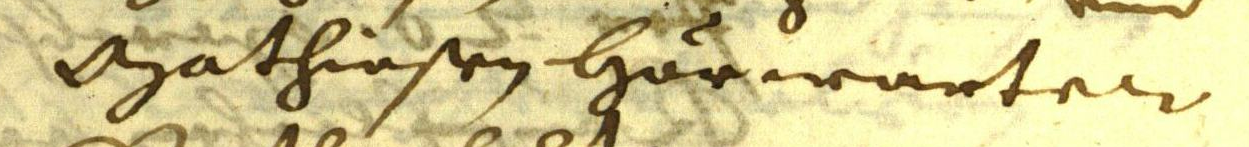Mathiasen Hōrwarter
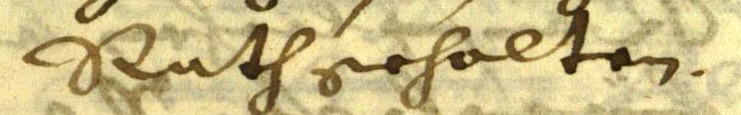Rath gehalten.
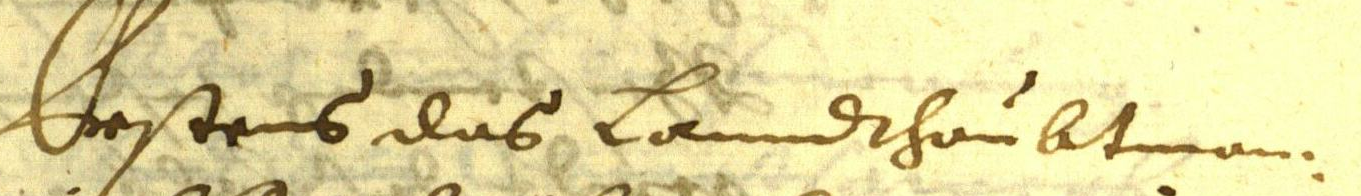Erstens das Lanndthaūbtman¬
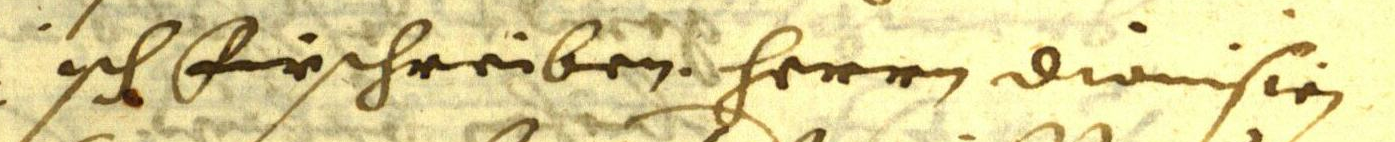isch Firschreiben. herrn dionisien
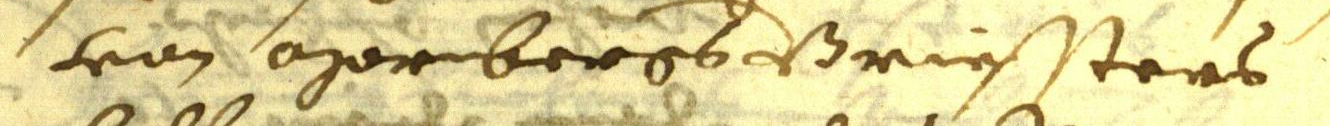von Mornbergs Briessters
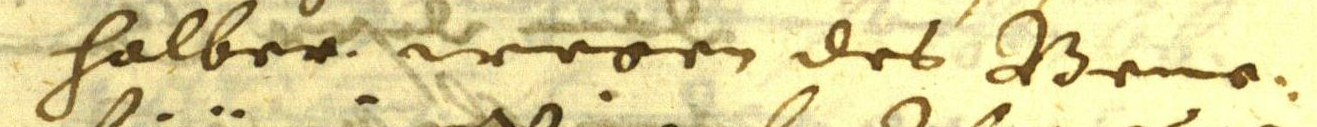halber. wegen des Bene¬
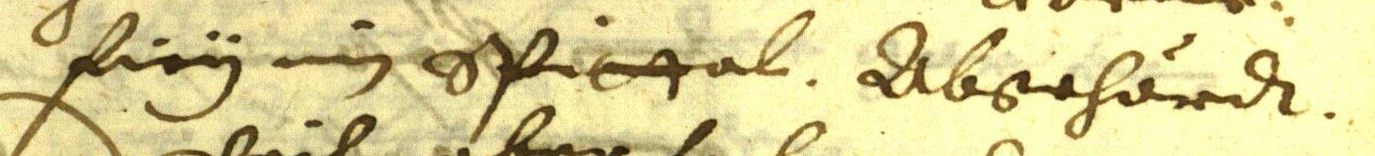ficÿ im Spittal. Abgehōrdt.
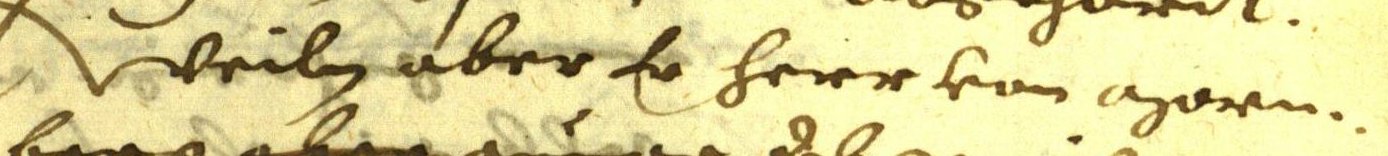Weiln aber Er herr von Morn¬
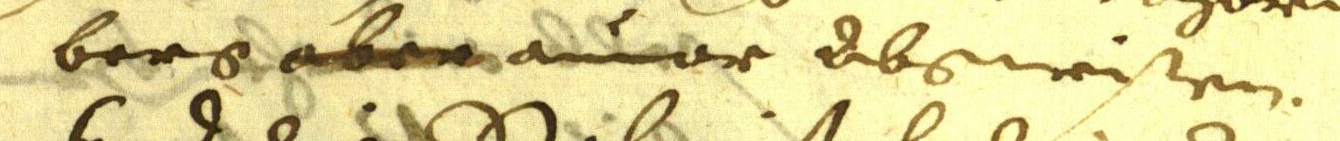berg aber anvor Abgwisen.
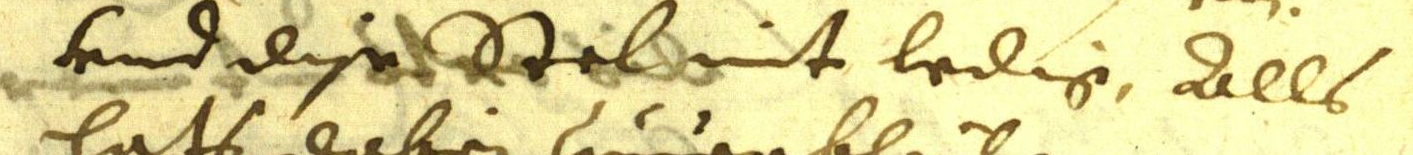vnd dise Stel nit ledig, Alls
